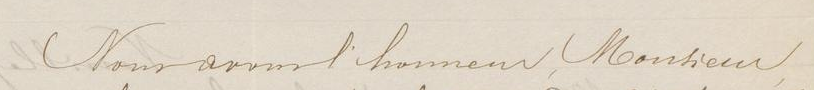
Nous avons l'honneur, Monsieur,
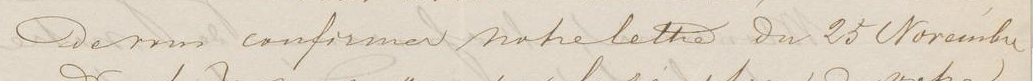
de vous confirmer notre lettre du 25 Novembre
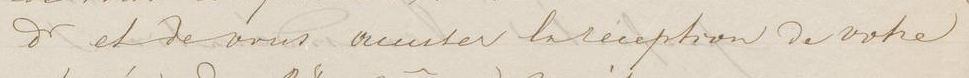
dr et de vous accuser la réception de votre
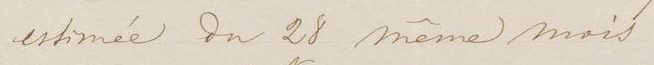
estimée du 28 même mois.
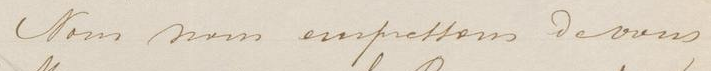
Nous nous empressons de vous
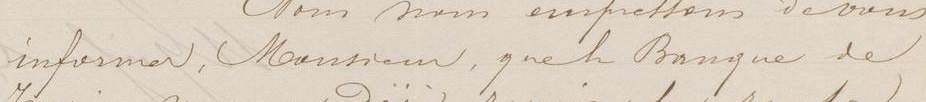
informer, Monsieur, que la Banque de
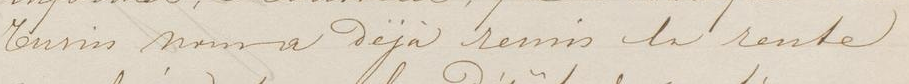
Turin nous a déjà remis la rente
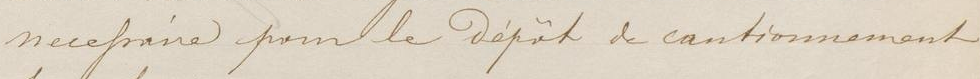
necessaire pour le dépôt de cautionnement
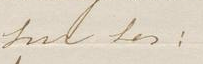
sur les:
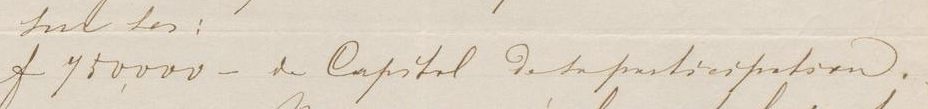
f 750,000– de Capital de sa participation.
